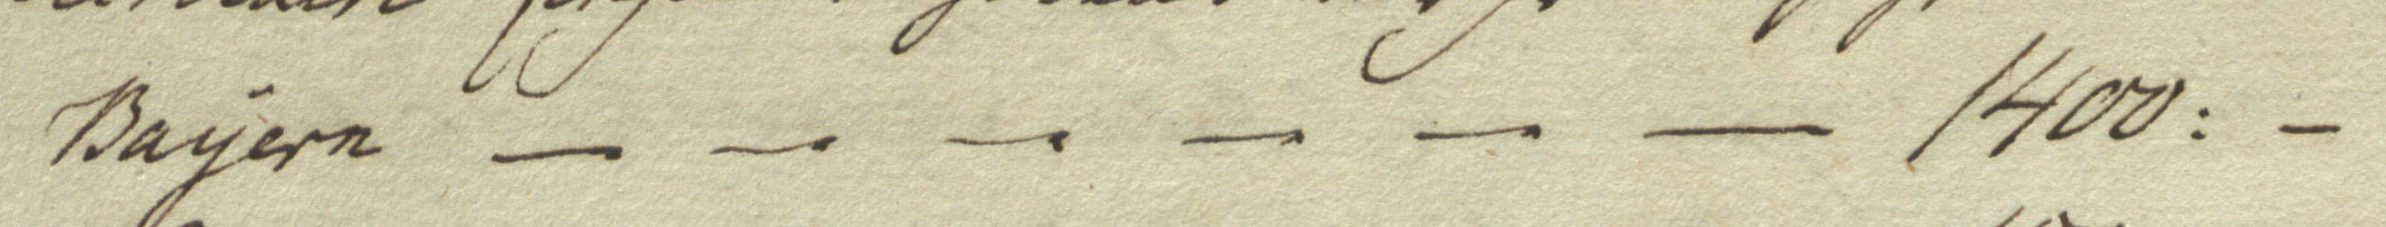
Baÿern 1400:
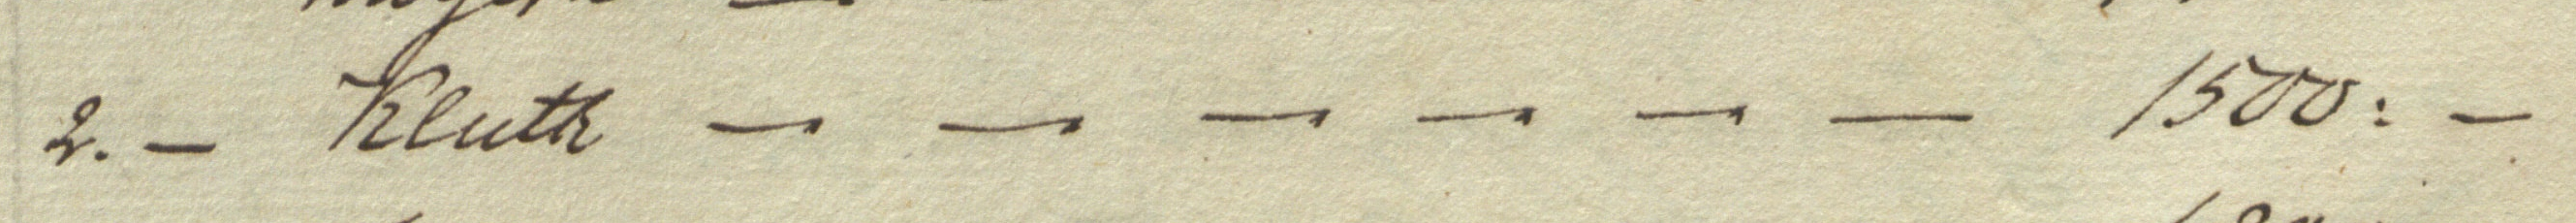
2. Kluth 1500:
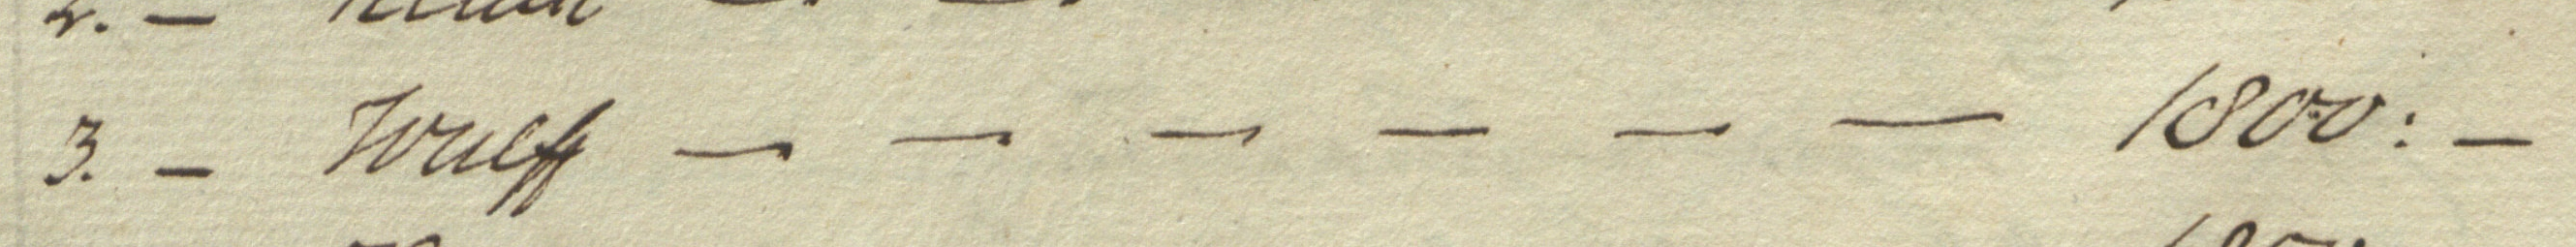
3. Wulff 1800:
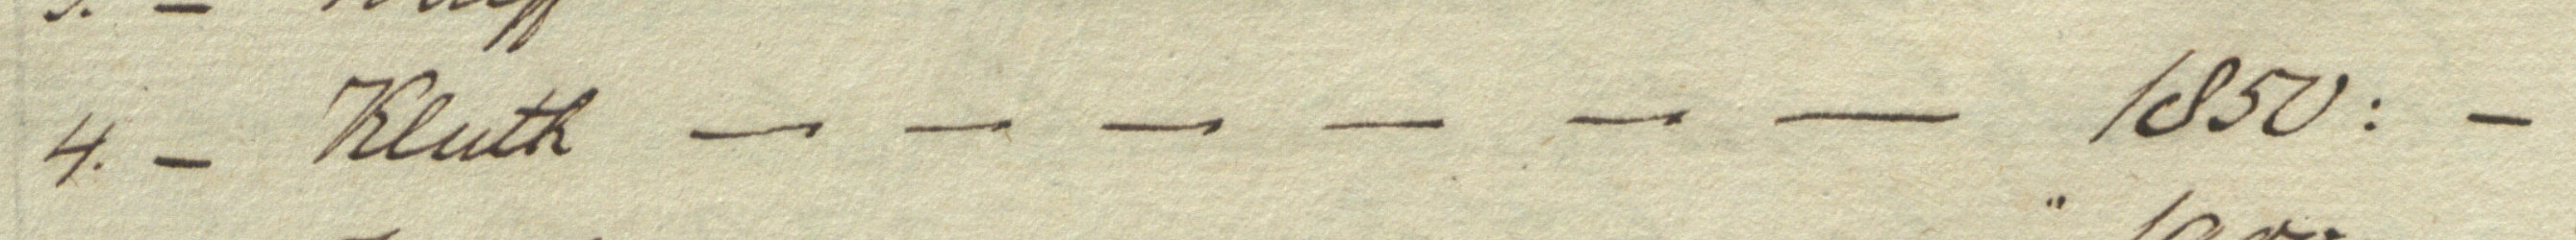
4. Kluth 1850:
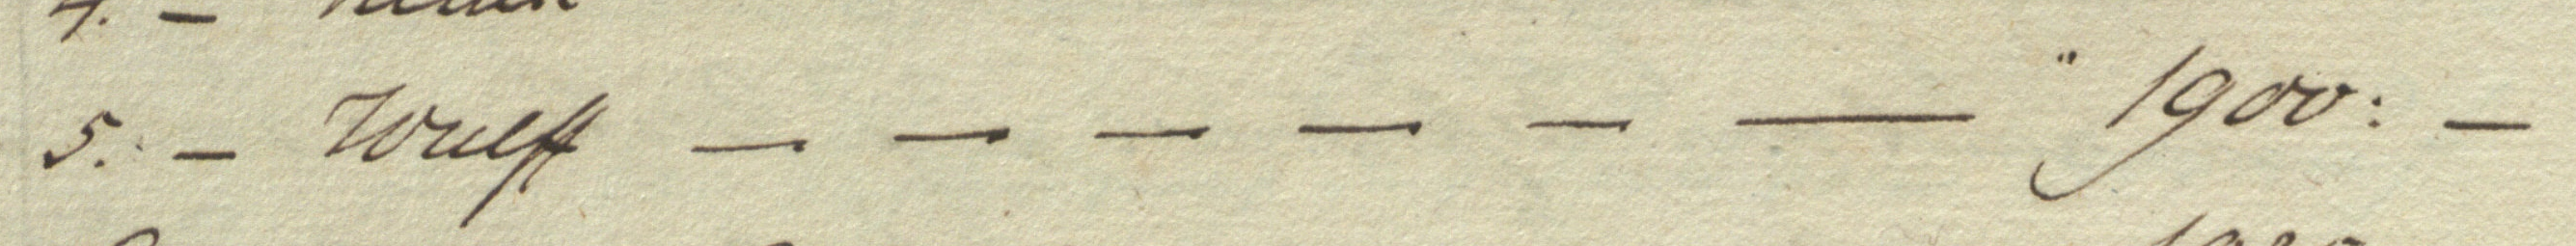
5. Wulff 1900:
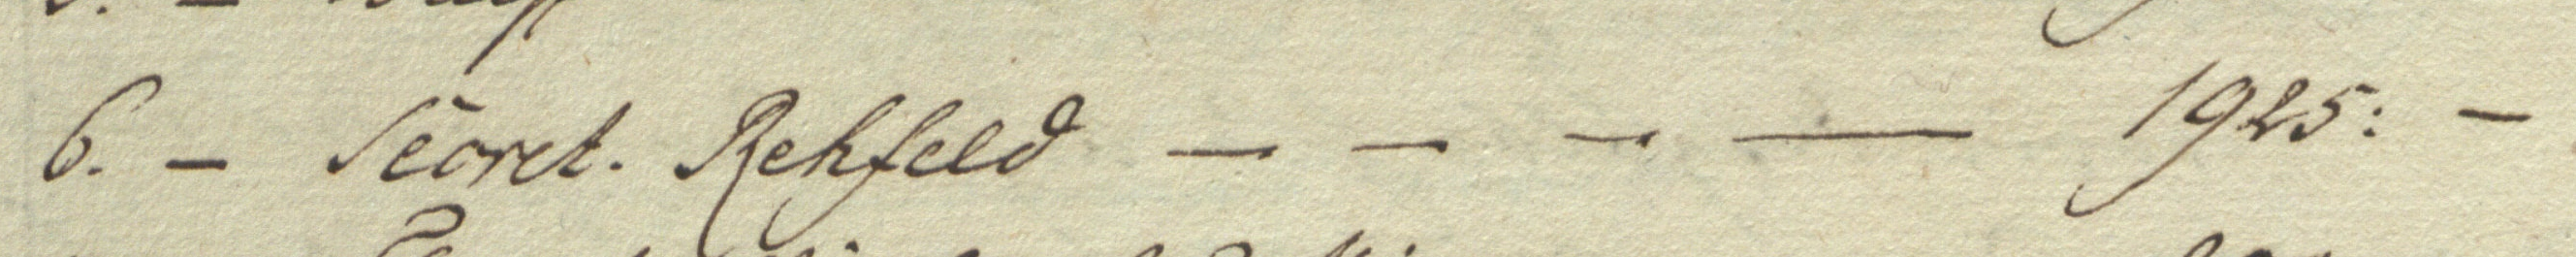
6. Secret. Rehfeld 1925:
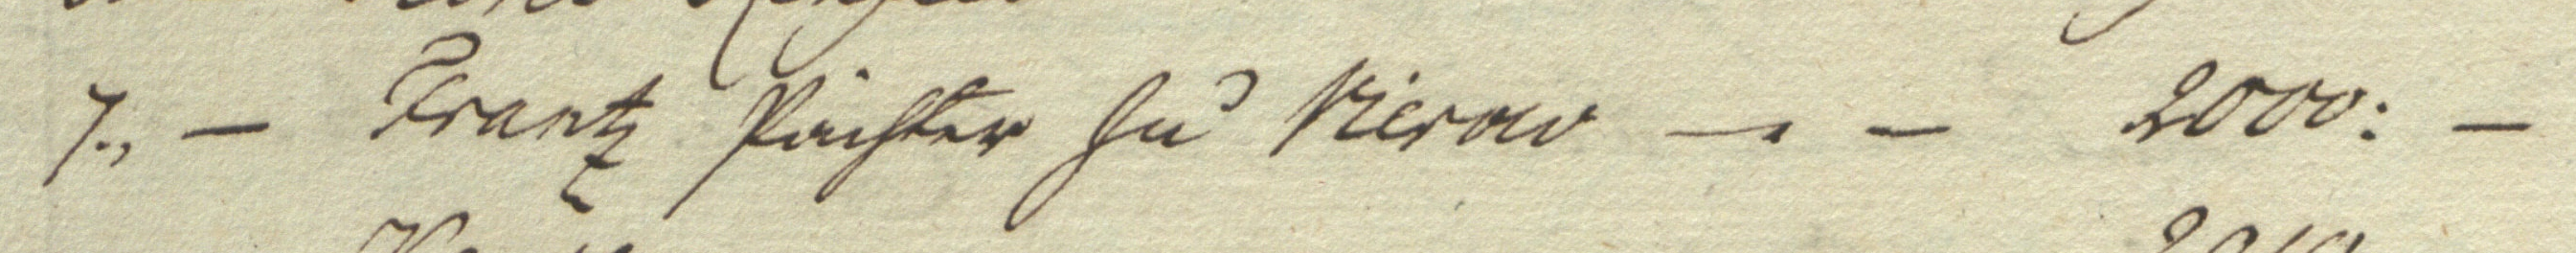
7. Frantz Pächter zu Vierow 2000:
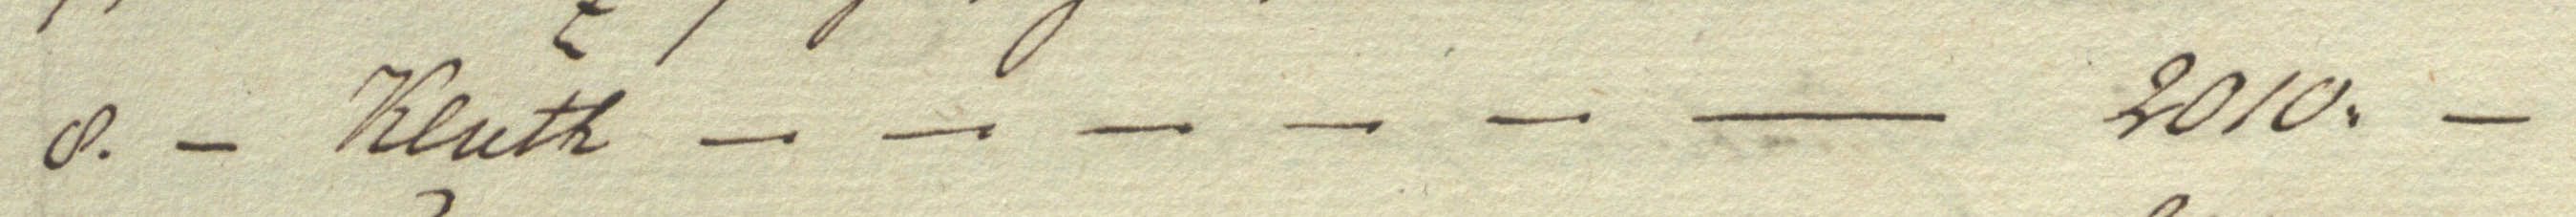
8. Kluth 2010:
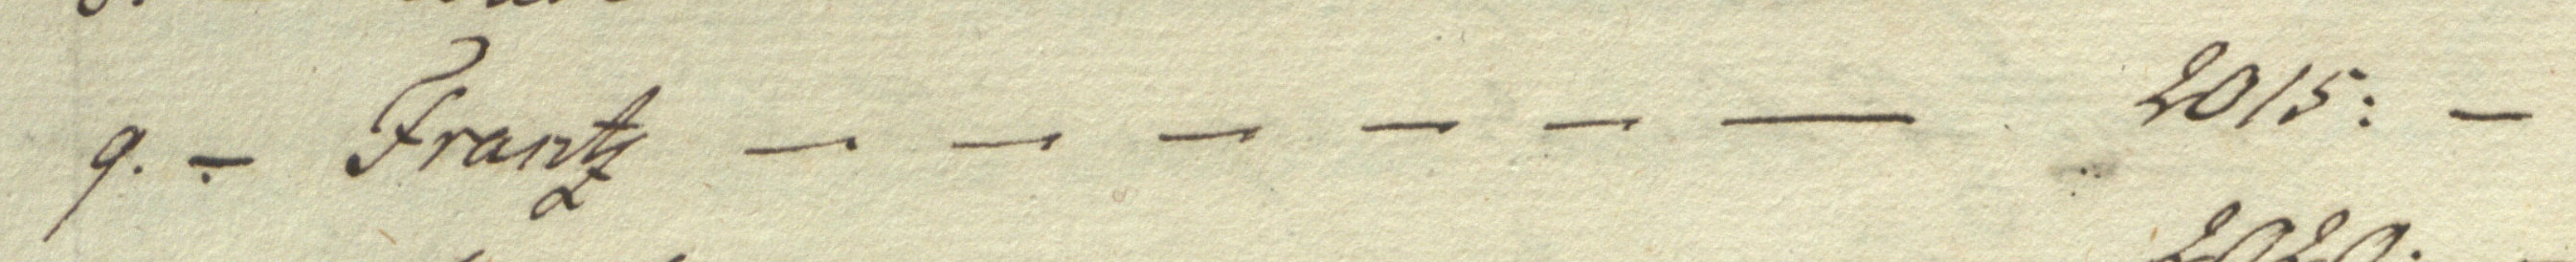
9. Frantz 2015:
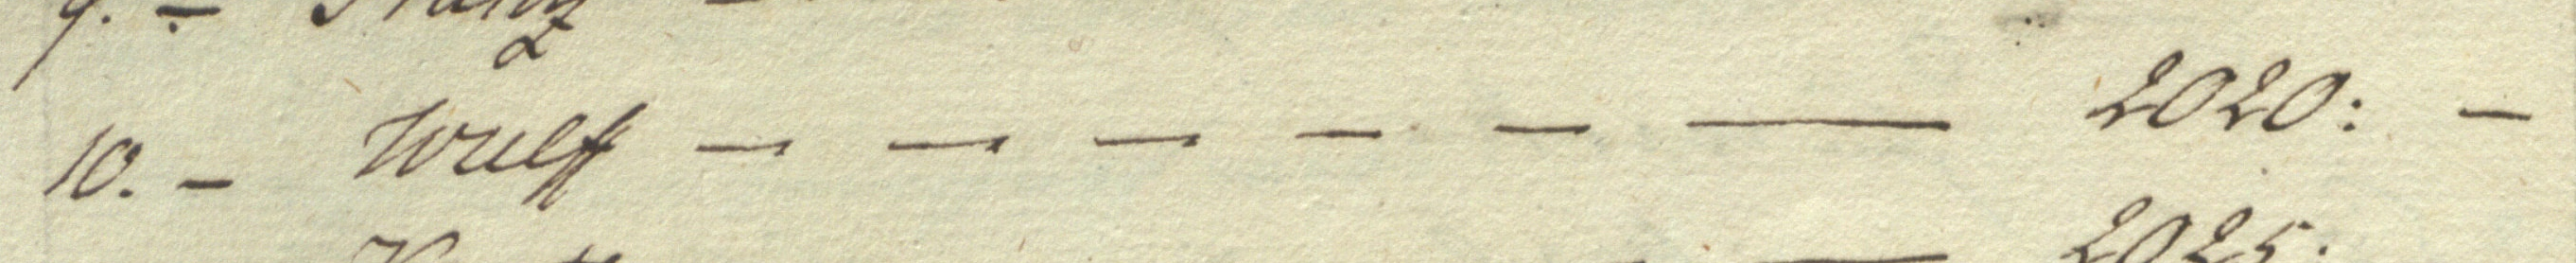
10. Wulff 2020:
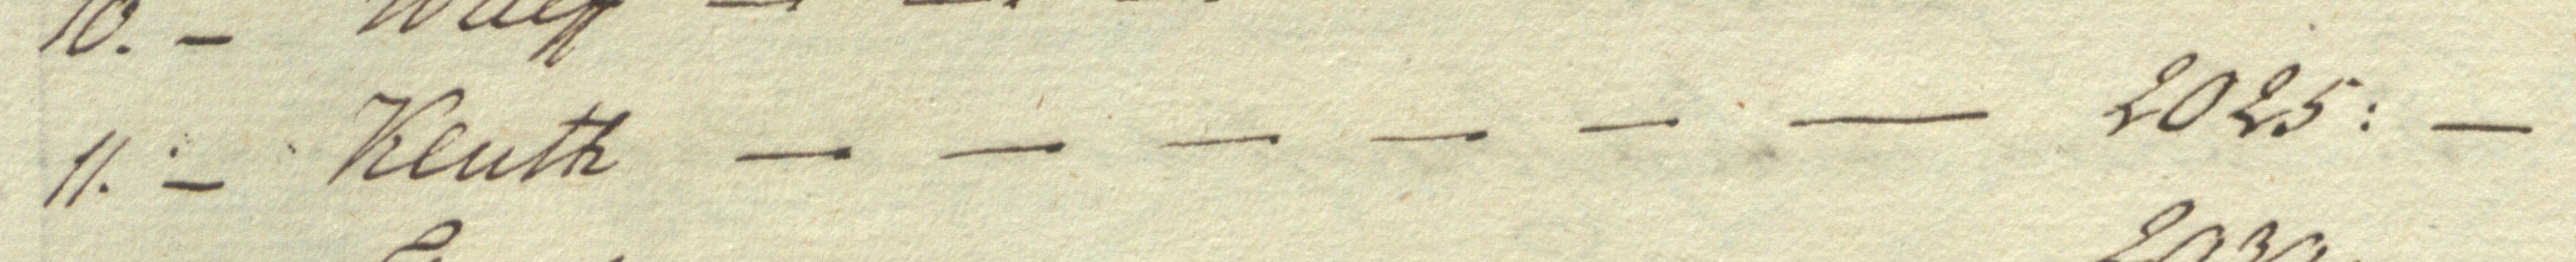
11. Kluth 2025:
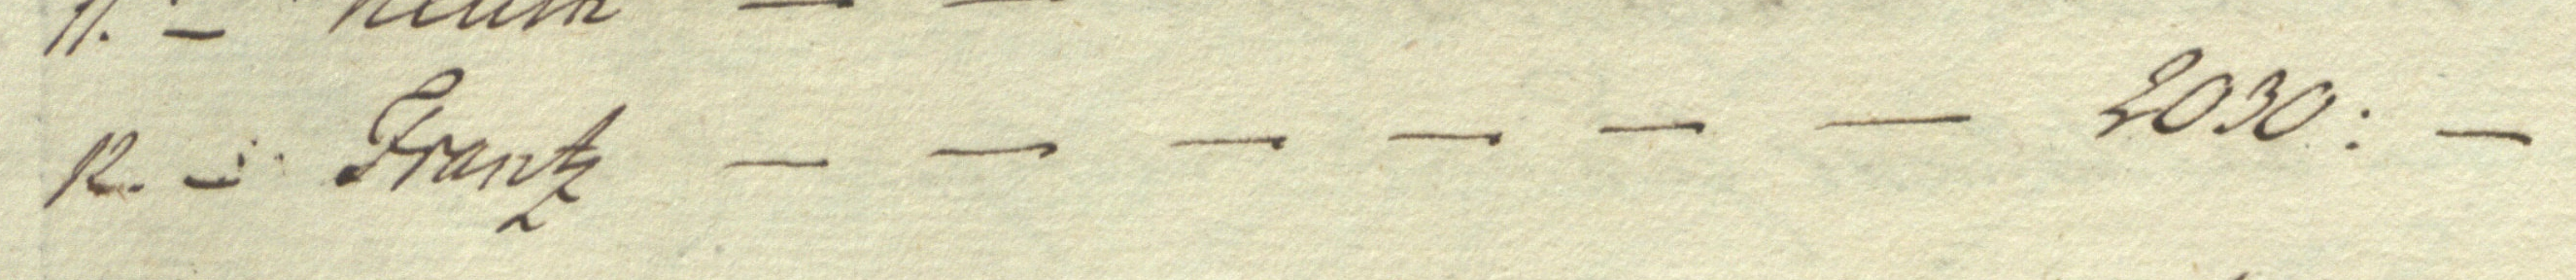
12. Frantz 2030:
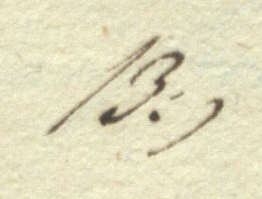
13.,
